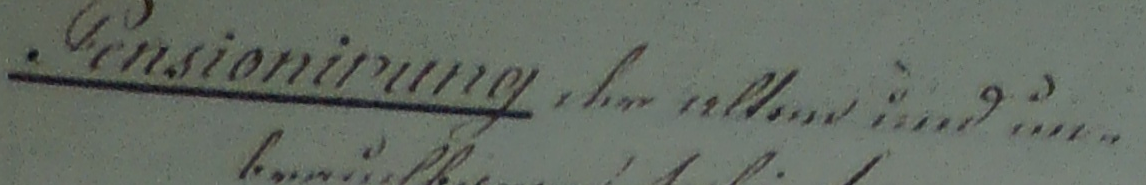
Pensionirung der alten und un¬
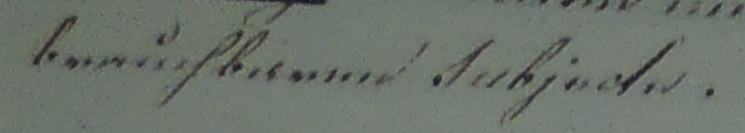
brauchbaren Subjecte.
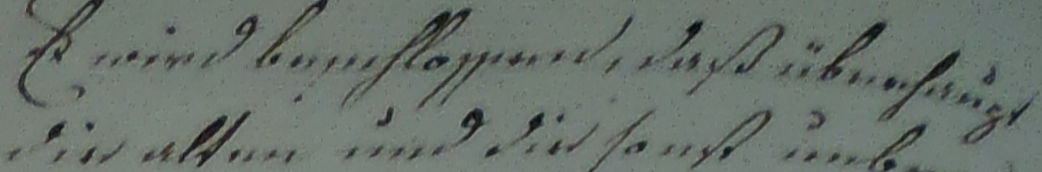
Es wird beschlossen, daß überhaupt
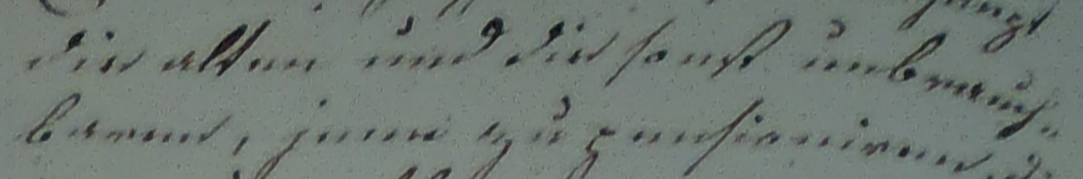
die alten und die sonst unbrauch¬
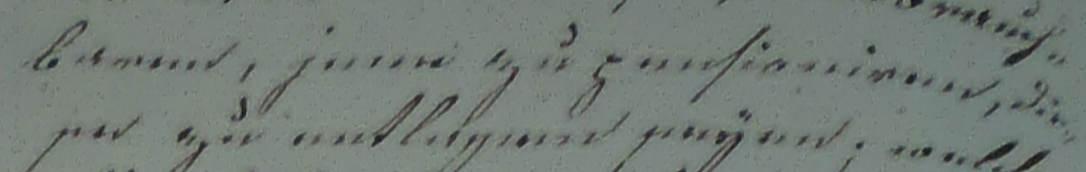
baren, jene zu pensioniren, die¬
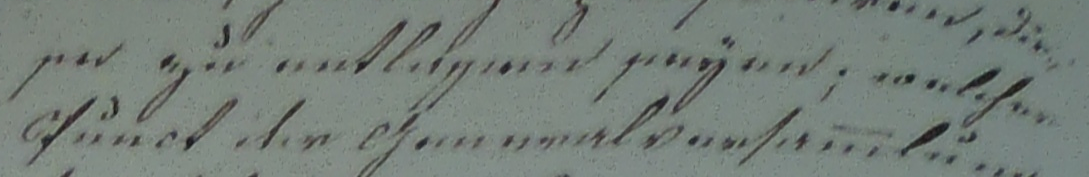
se zu entlassen seyen; welcher
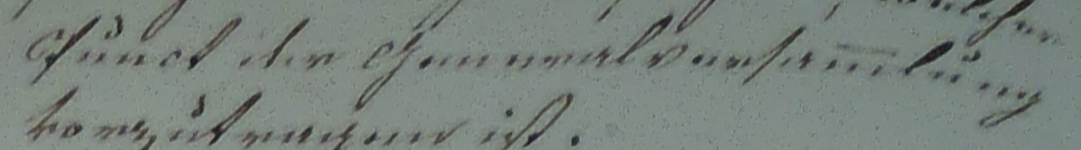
Punct der Generalversamlung
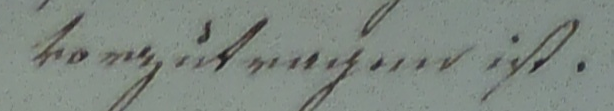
vorzutragen ist.
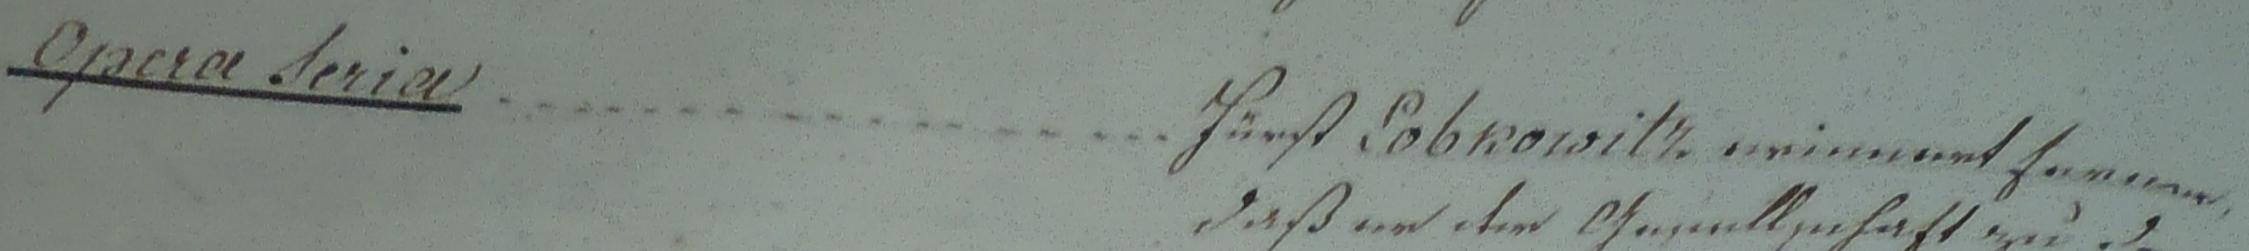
Opera Seria …………….. Fürst Lobkowitz erinnert ferner,
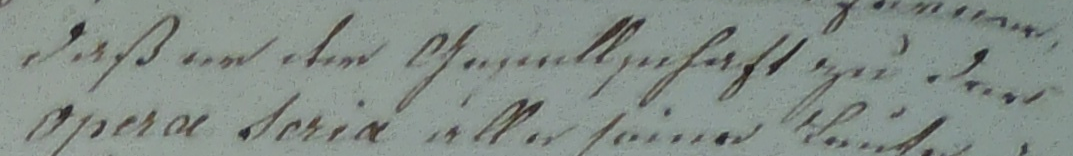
daß er der Gesellschaft zu der
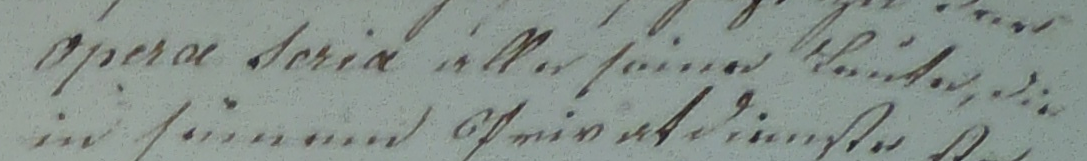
Opera Seria alle seine Leute, die
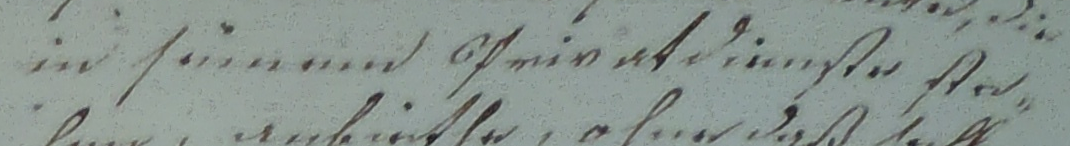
in seinem Privatdienste ste¬
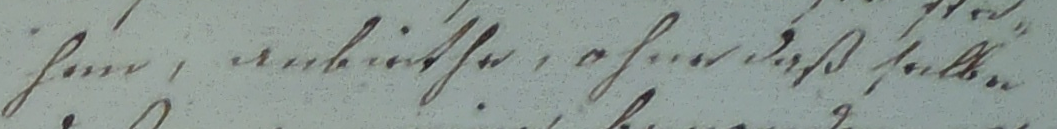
hen, anbiethe, ohne daß selbe
